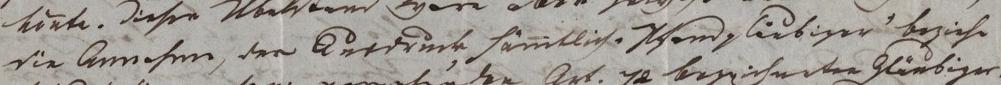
die Annahme, der Ausdruck «sämmtliche Pfandgläubiger» beziehe
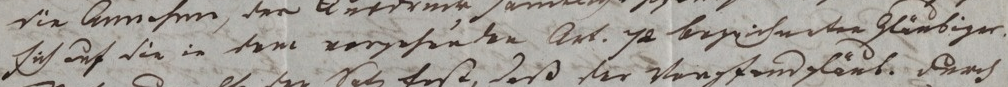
sich auf die in dem vorgehenden Art. 72 bezeichneten Gläubiger.
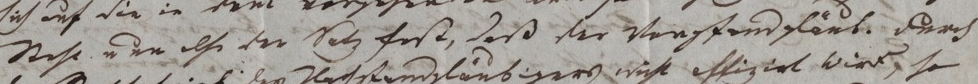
Steht nun also der Satz fest, daß der Vorpfandgläub. durch
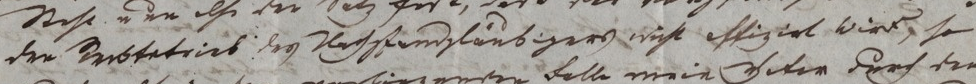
den Rechtetrieb des Nachpfandgläubigers nicht affizirt wird, so
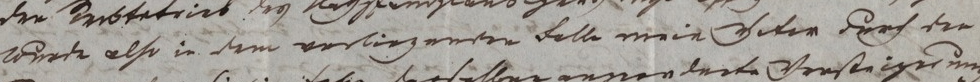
wurde also in dem vorliegenden Falle mein Vater durch den
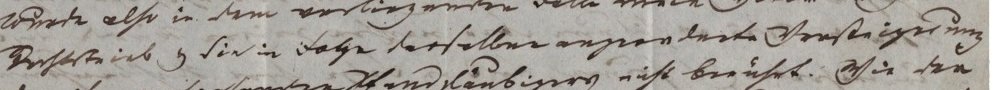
Rechtstrieb & die in Folge desselben angeordnete Versteigerung
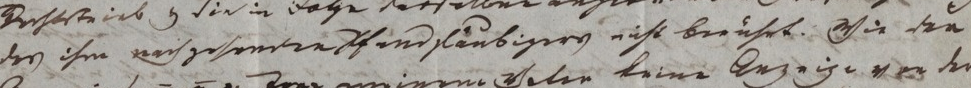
des ihm nachgehenden Pfandgläubigers nicht berührt. Wie der
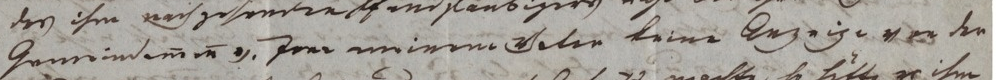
Gemeindammann v. Jona meinem Vater keine Anzeige von der
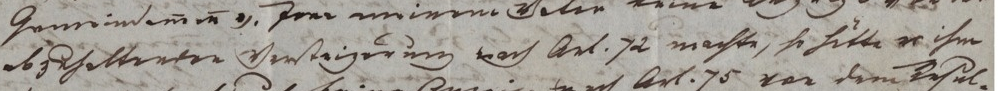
abzuhaltenden Versteigerung nach Art. 72 machte, so hätte er ihm
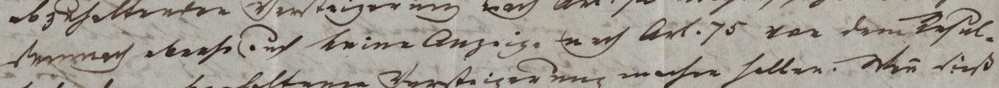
demnach ebenso auch keine Anzeige nach Art. 75 von dem Resul-
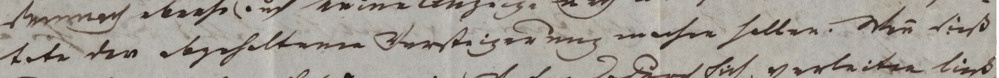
tate der abgehaltenen Versteigerung machen sollen. Wenn dieß
